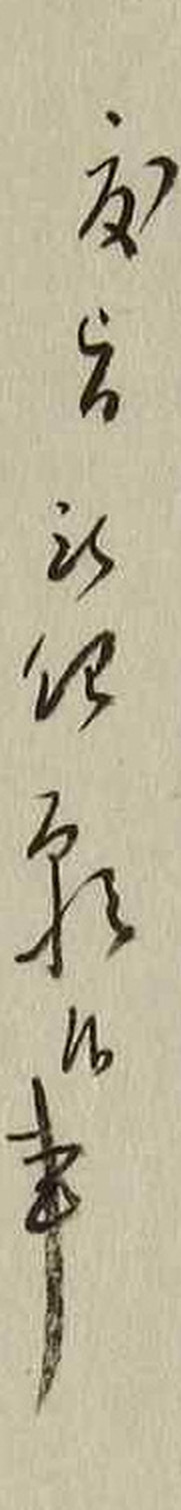度旨被任願候事
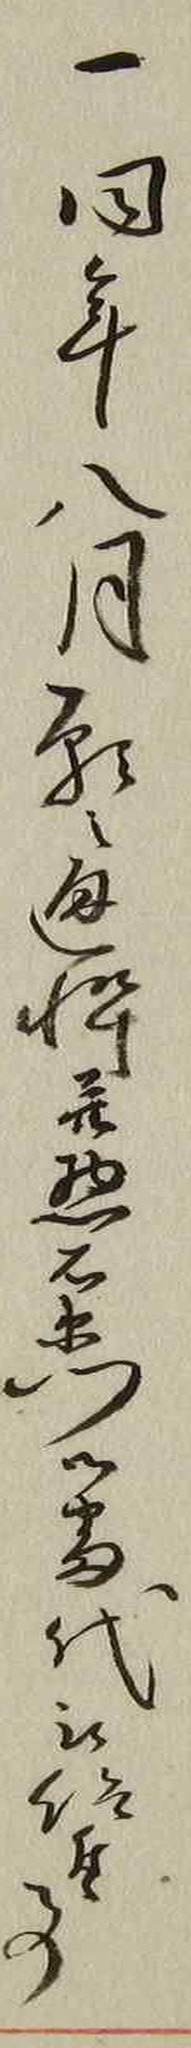一同年八月願之通忰喜惣右衛門御番代被仰付候事
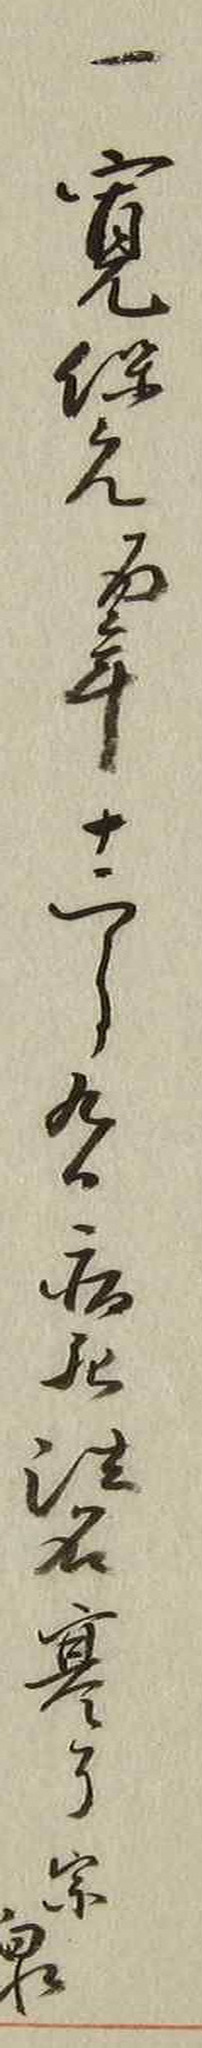一寛保元酉年十二月九日病死法名寒耳宗泉
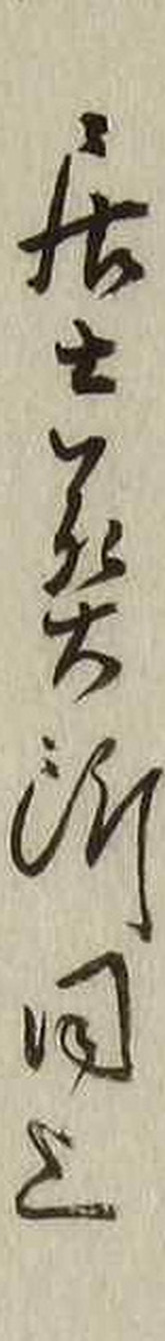居士葬所同上
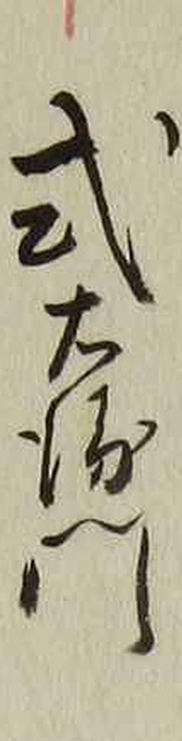式右衛門
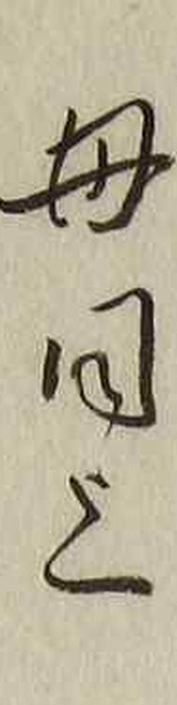母同上
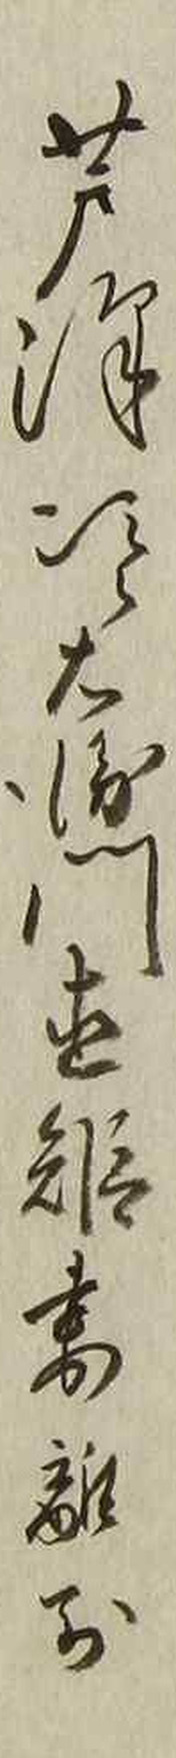女芦澤次郎右衛門直矩妻離別
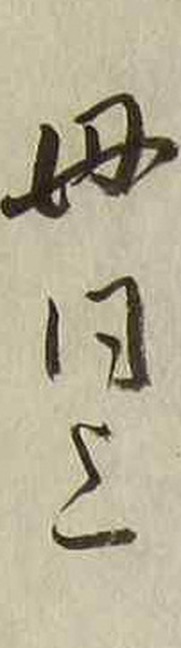母同上

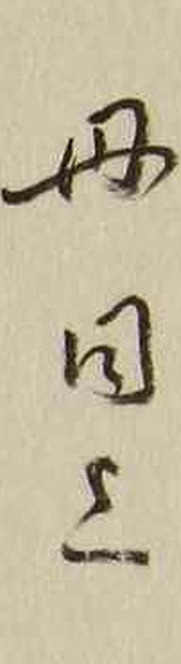母同上
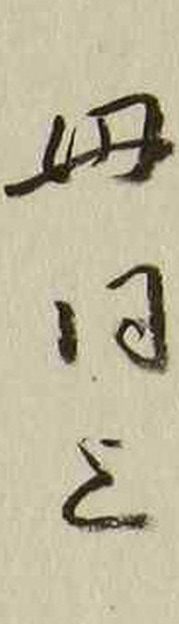母同上
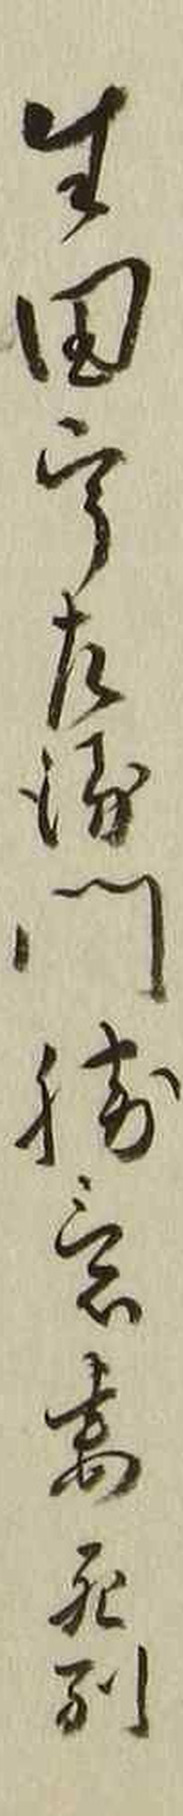女生田宇左衛門勝寅妻死別
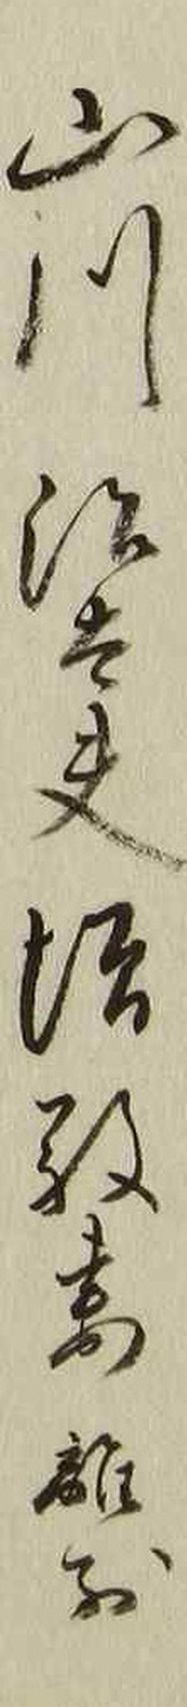山川治太夫増敦妻離別
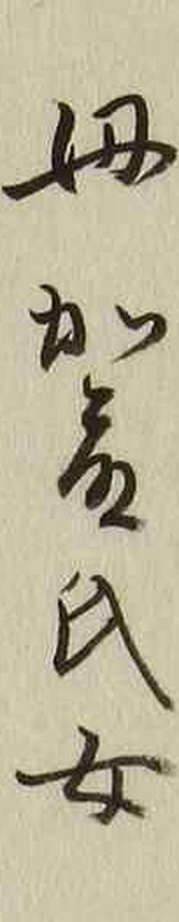母加藤氏女
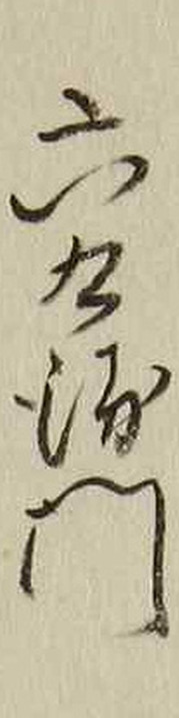六左衛門
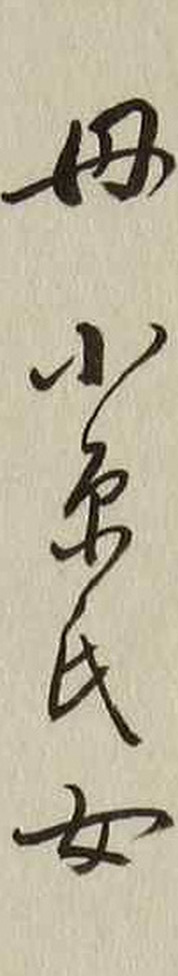母小原氏女
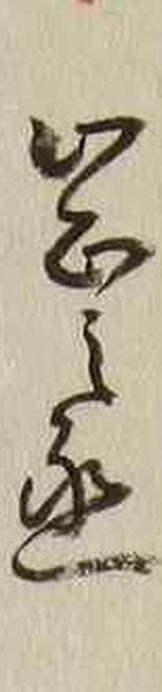岡之丞
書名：諸士系譜　巻之6　い之部6
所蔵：会津若松市立会津図書館
